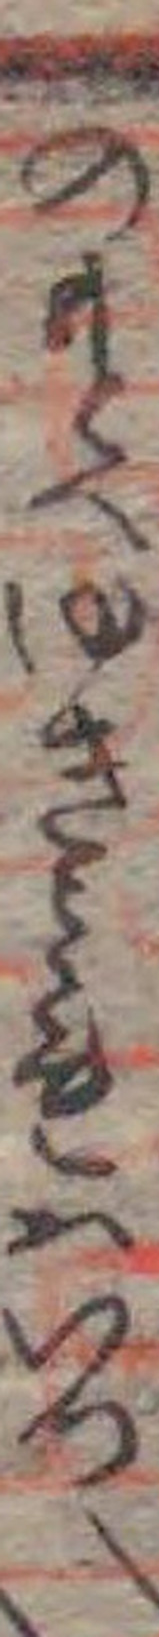のもとへゆきみれはいつ
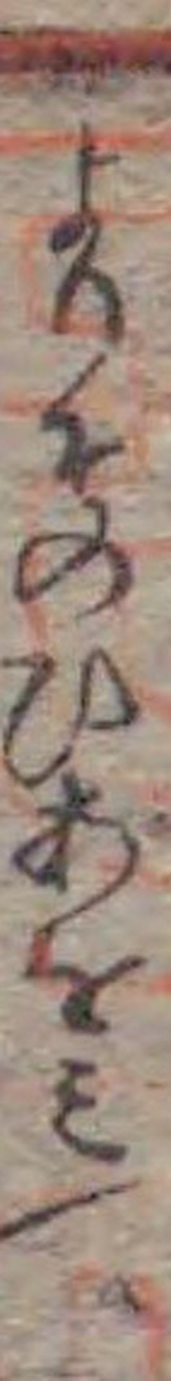よりそのひあをみ
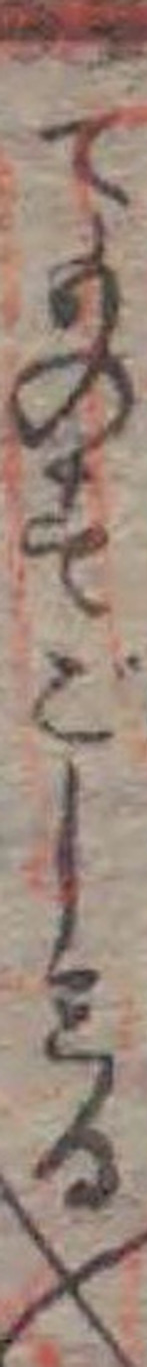てものすごしみる
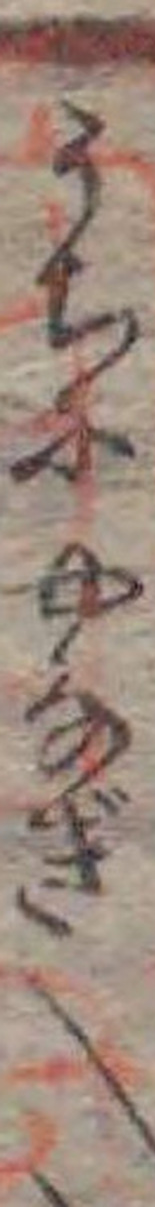うちにやなぎ
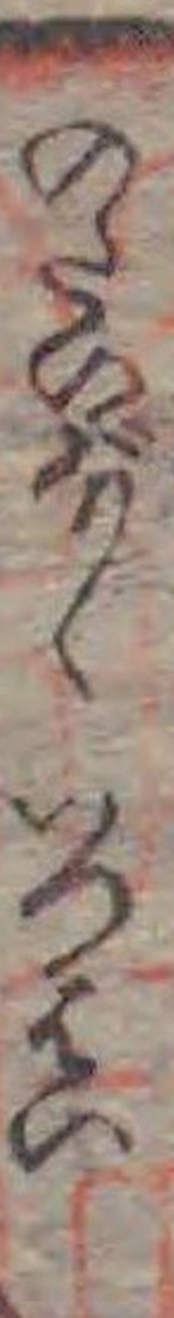のたいぼくいつはい
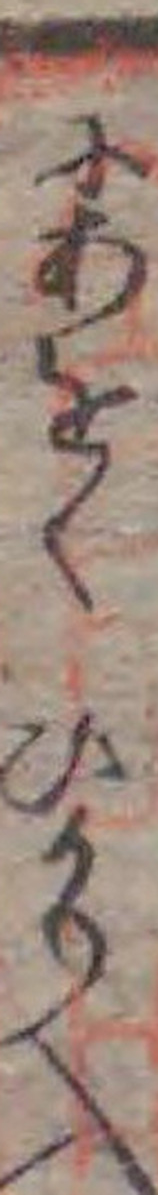にあを〳〵ひかり
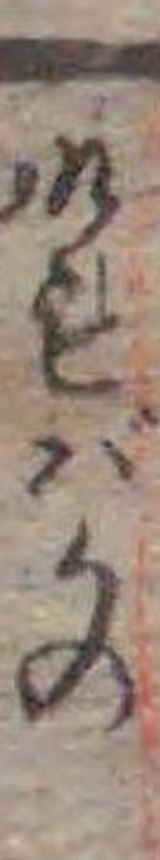ければかの
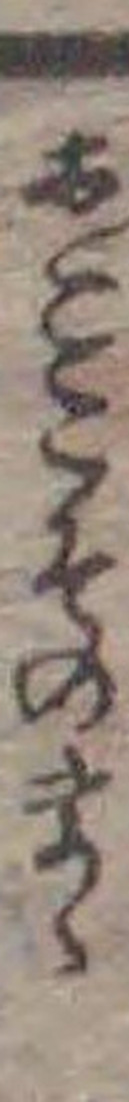おとこそのまゝ
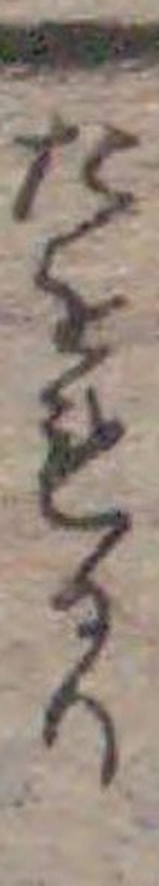たをれるか
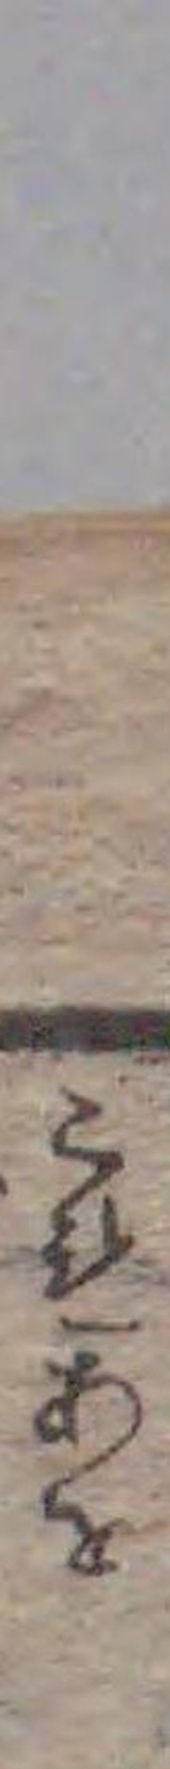これあを
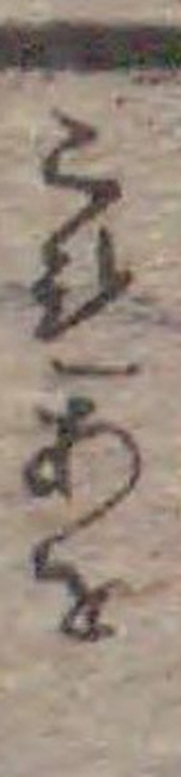これあを
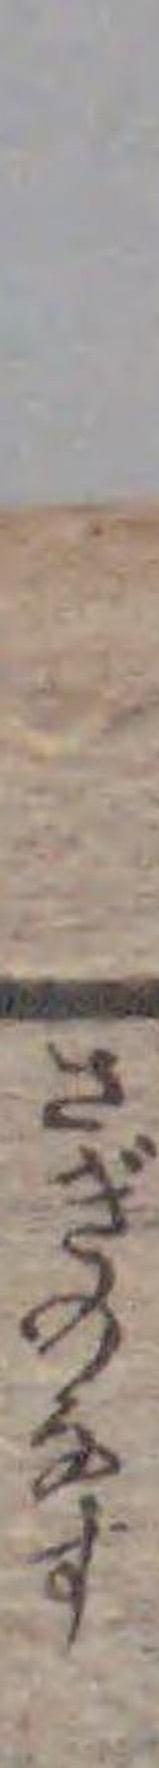さぎのなす
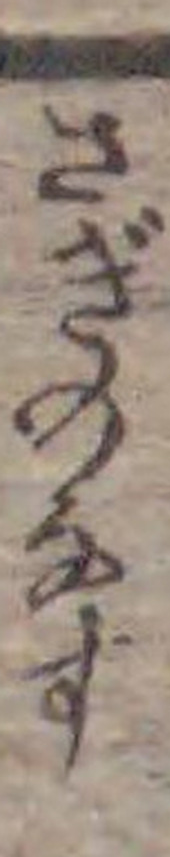さぎのなす
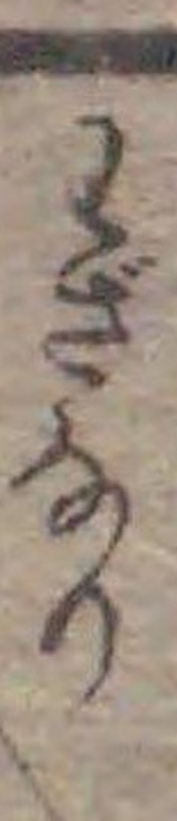わざなり

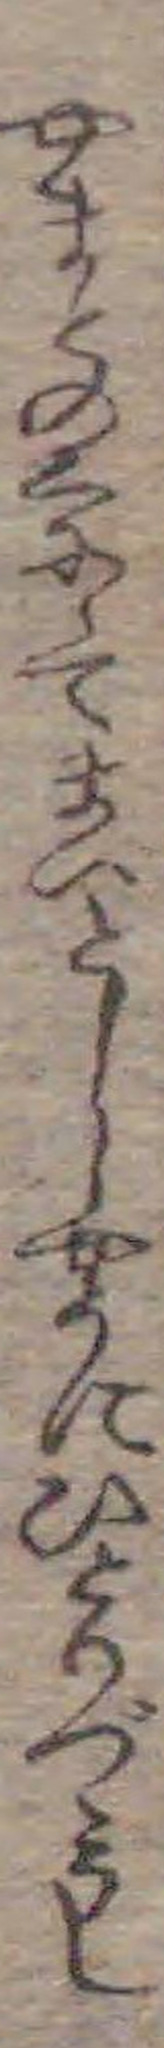やまとのくにゝてまいとしのやうにひとかづみと
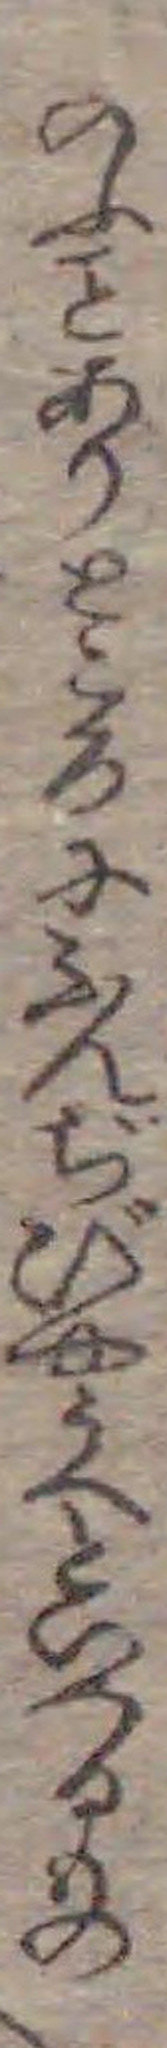いふことありところにふんぢびやうへといへるもの
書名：変化物春遊 : 2巻
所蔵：国立国会図書館 National Diet Library, JAPAN
